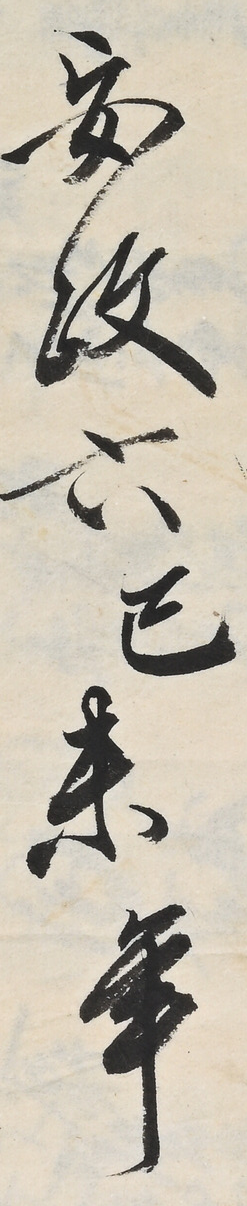㊞安政六己未年
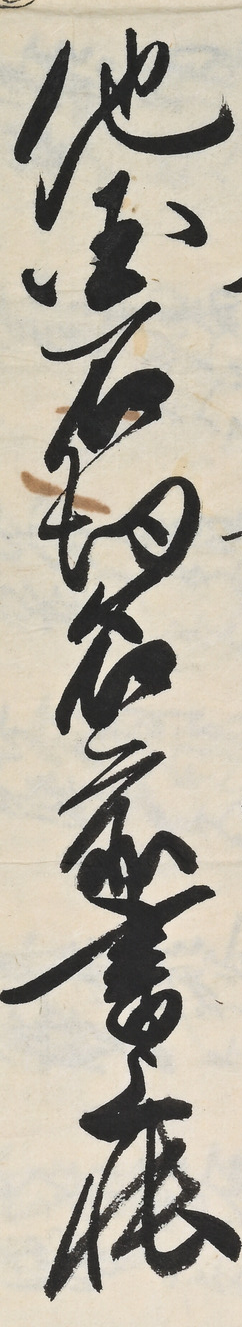他国石切名前書上帳

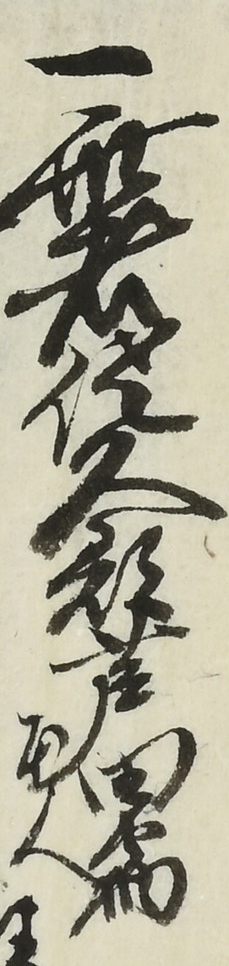一此者佐久郡芦田宿

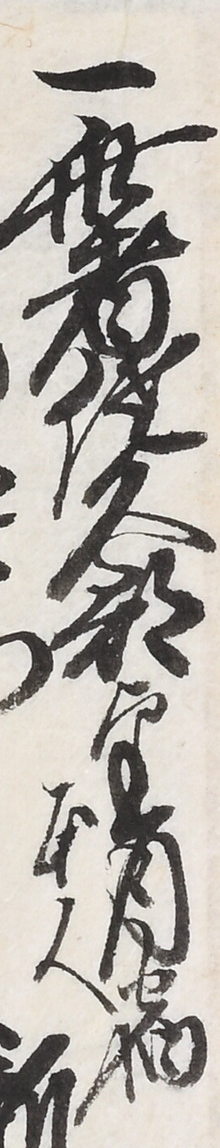一此者佐久郡望月宿
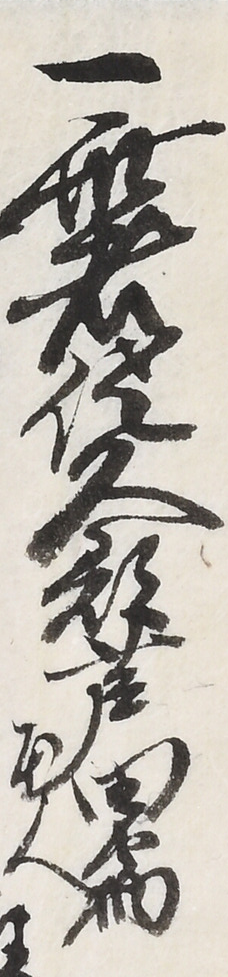一此者佐久郡芦田宿
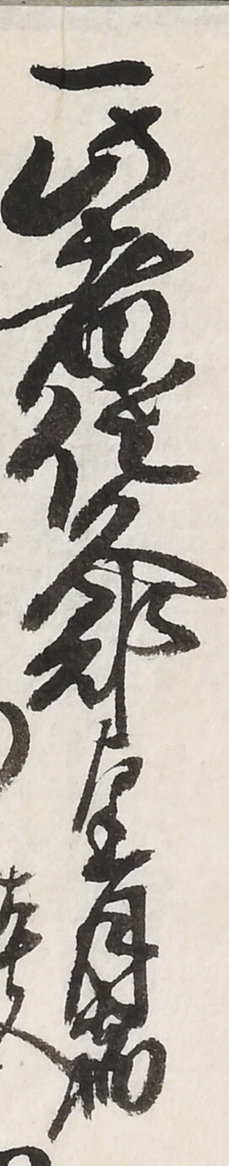一此者佐久郡望月宿
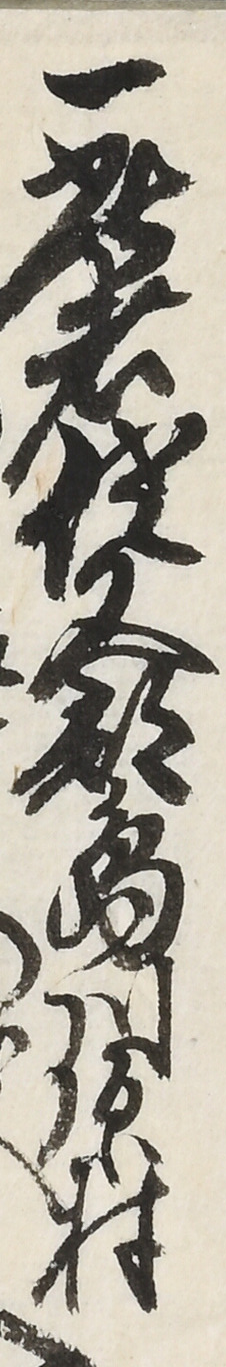一此者佐久郡島川原村
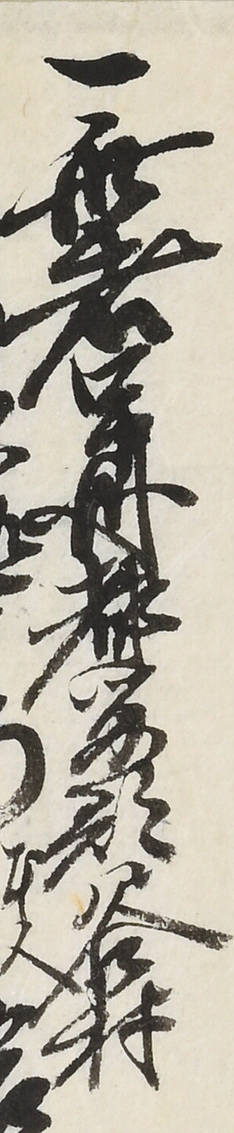一此者甲州都留郡谷村
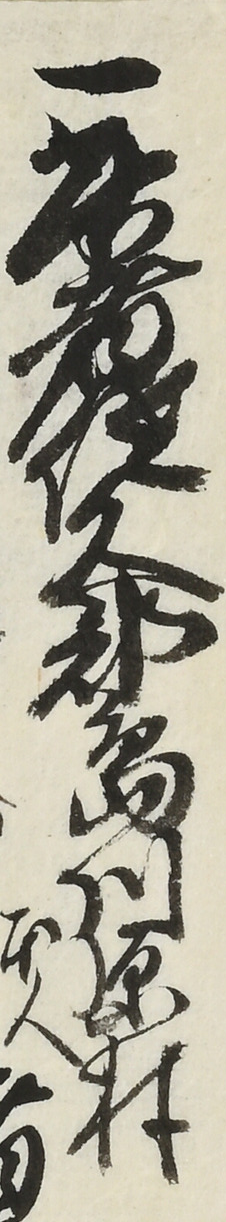一此者佐久郡島川原村

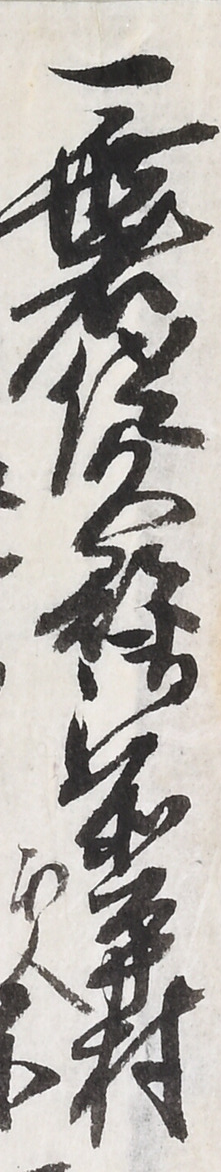一此者佐久郡御所平村
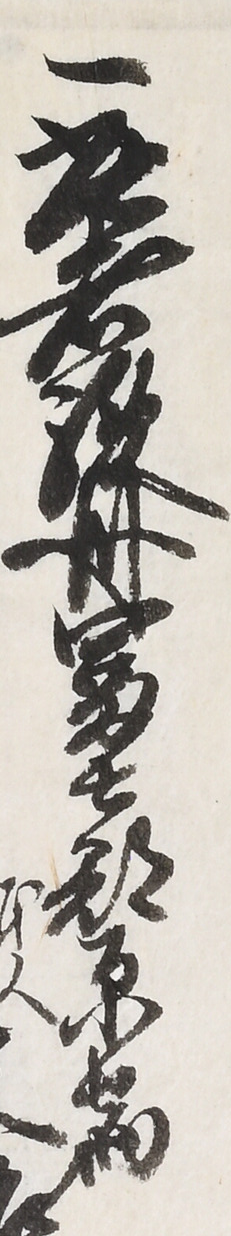一此者駿州富士郡原宿
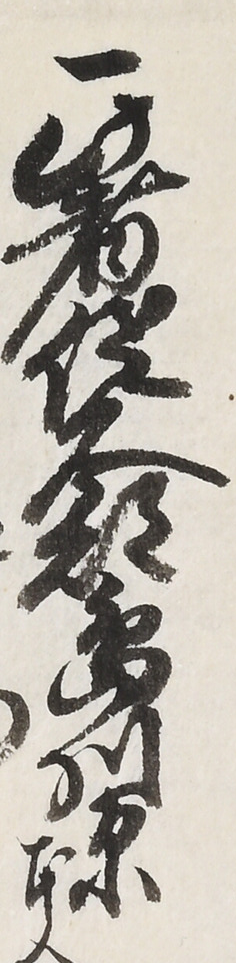一此者佐久郡島川原
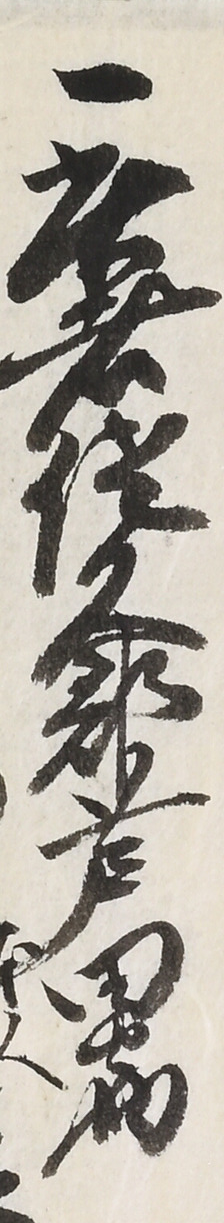一此者佐久郡芦田宿
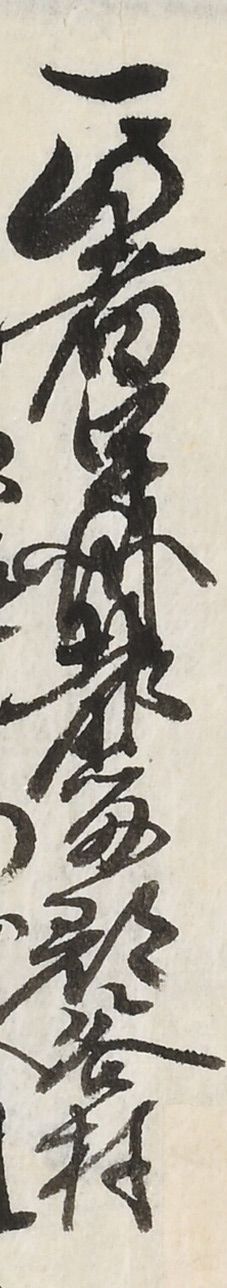一此者甲州都留郡谷村
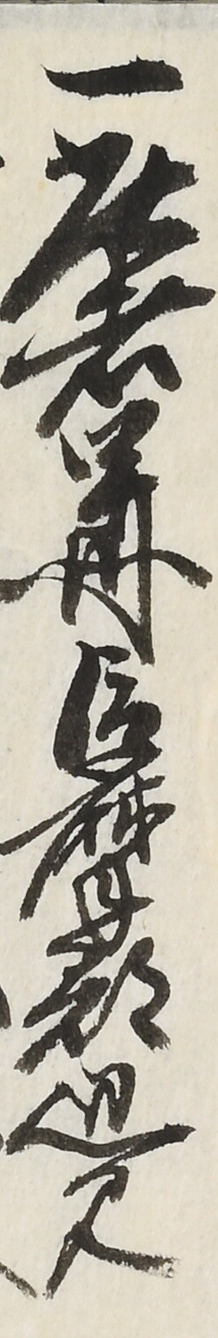一此者甲州巨摩郡辺見
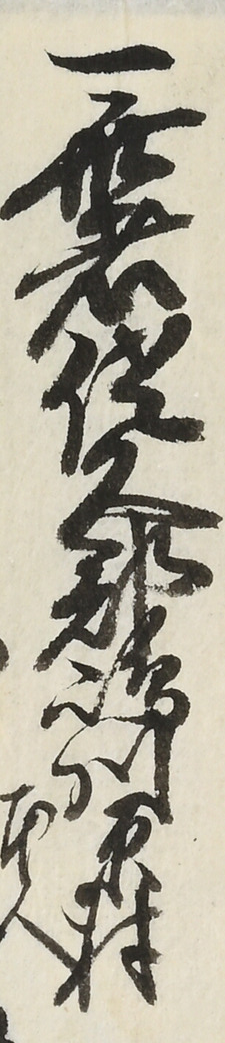一此者佐久郡島川原村
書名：安政六己未年正月他国石切名前書上帳
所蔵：伊那市立高遠町図書館・合同会社AMANE
